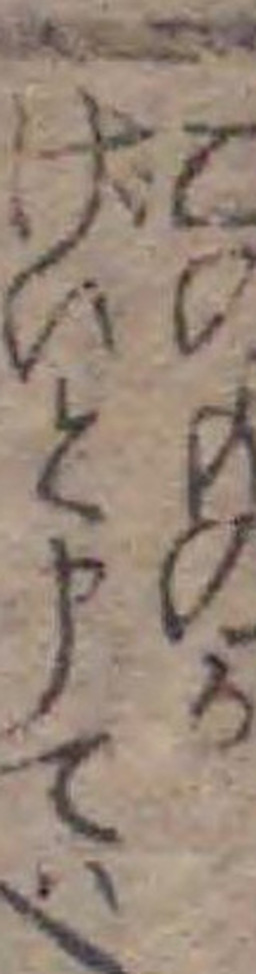げいと申ては
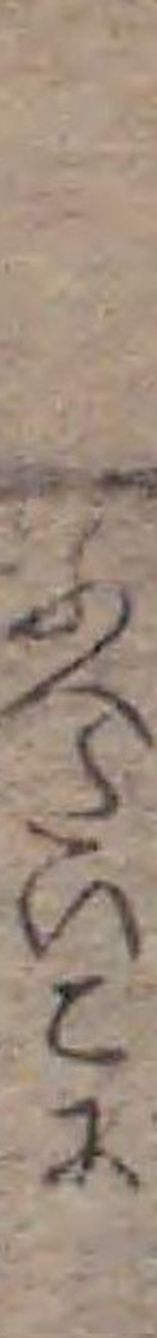ふへたいこに
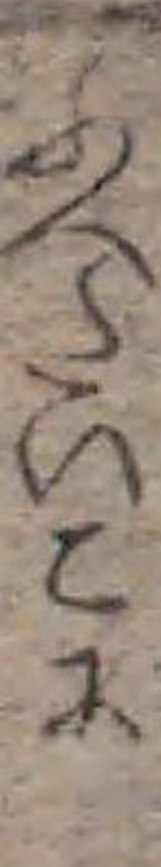ふへたいこに
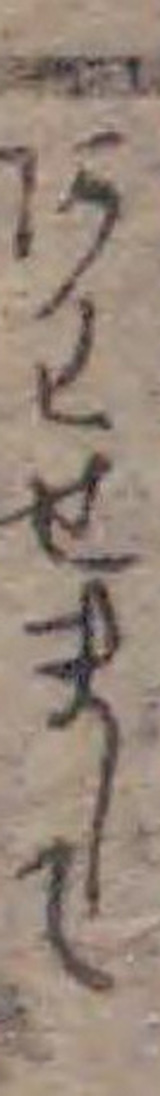あわせまして
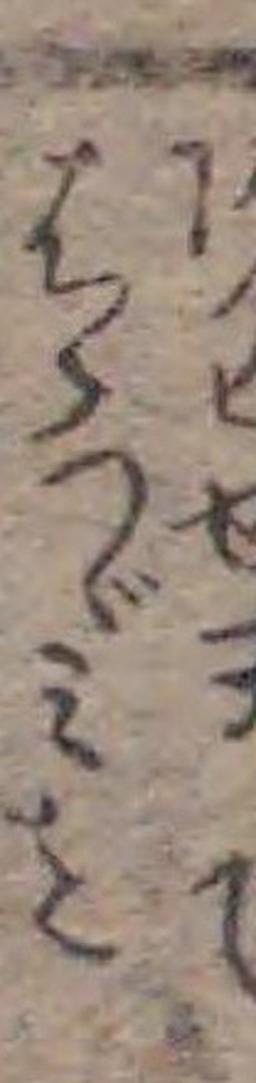はらつゞみを
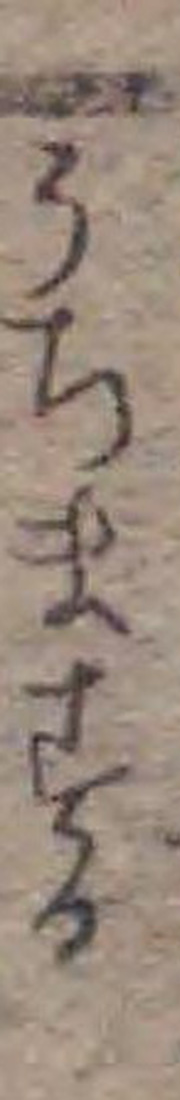うちまする
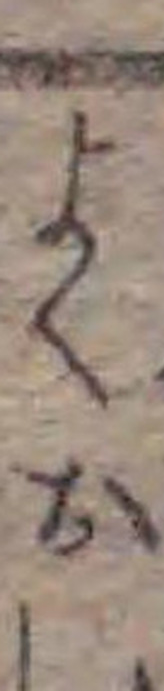よくお
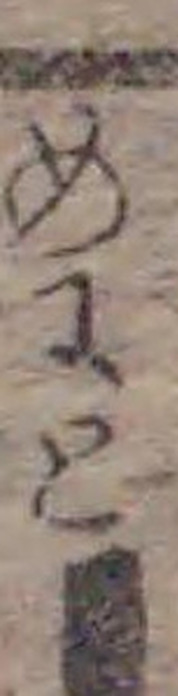めにと
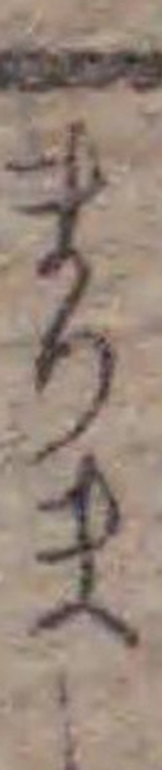まりま
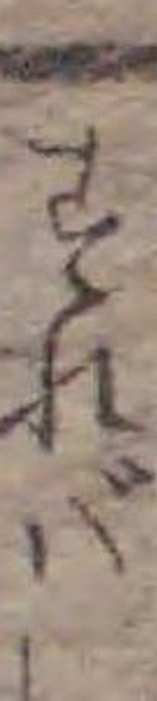すれば
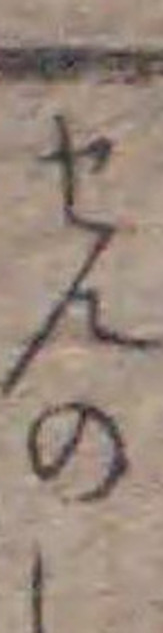せんの
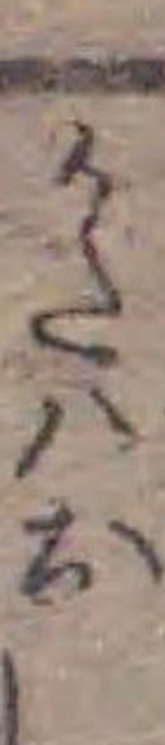かたはお
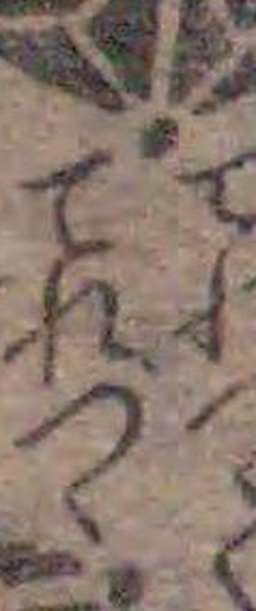てれつゝ
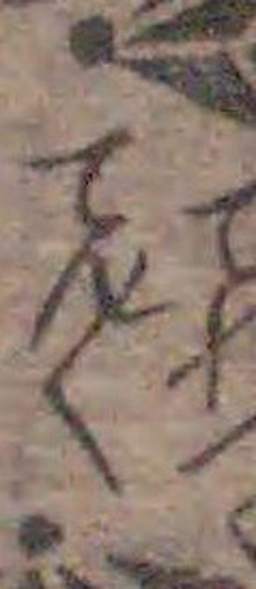てん〳〵

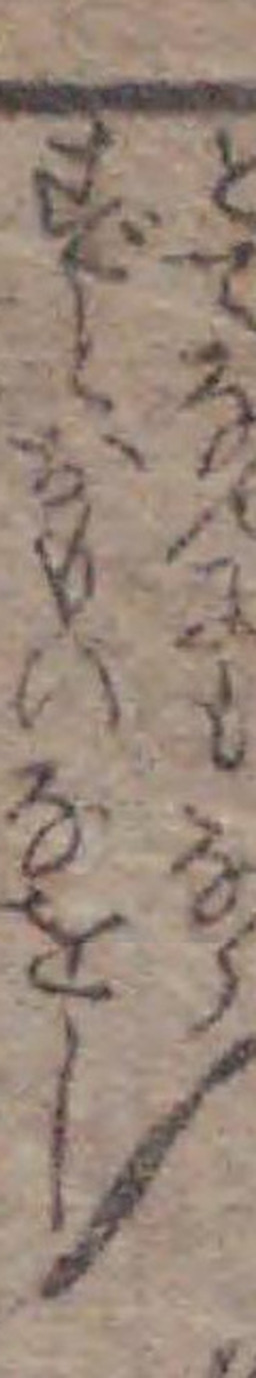ずとおもいなをし
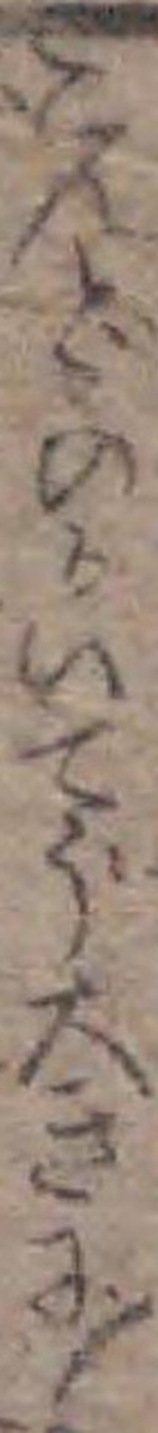こんどのかいてう大きに
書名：化物七段目 : 2巻
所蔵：国立国会図書館 National Diet Library, JAPAN
